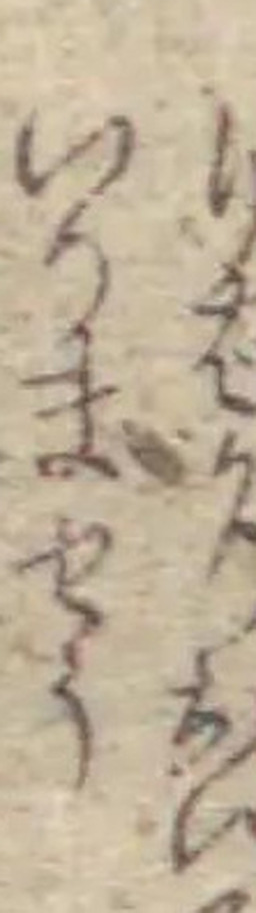いりませう
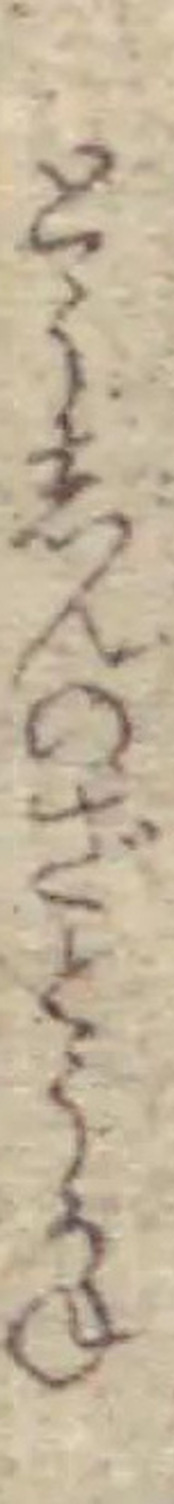とうしんのざとうかね
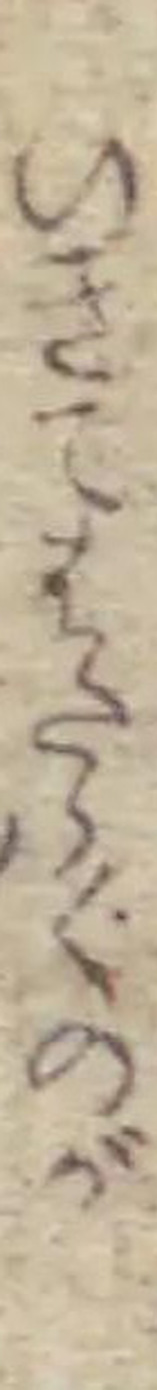いきてはたらくのが

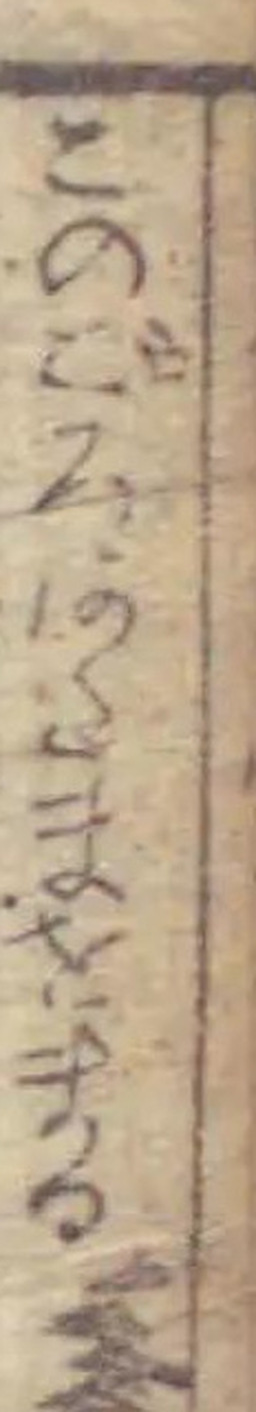このごろあたまをまる
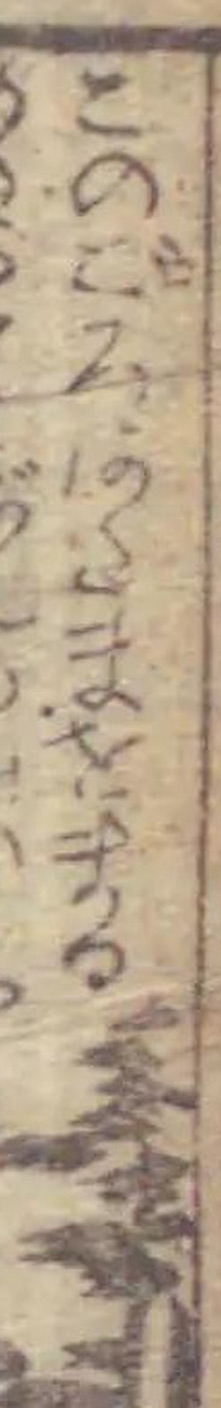このごろあたまをまる
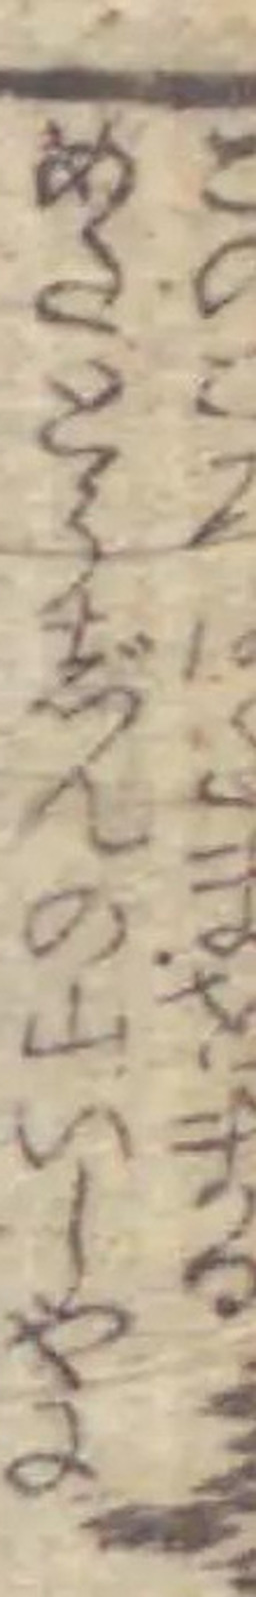めたとうじんの山いしやに
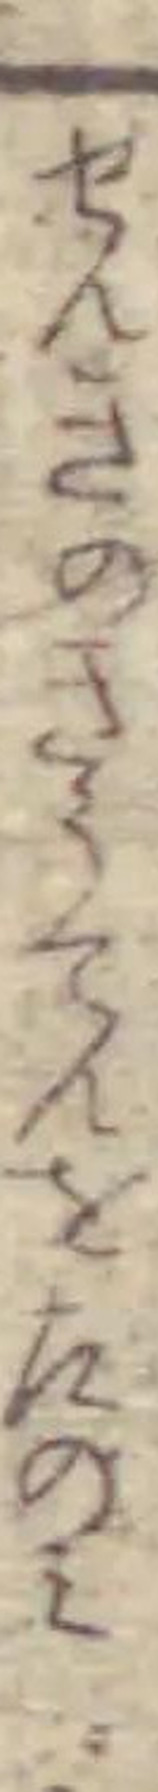せんきのきうてんをたのみ
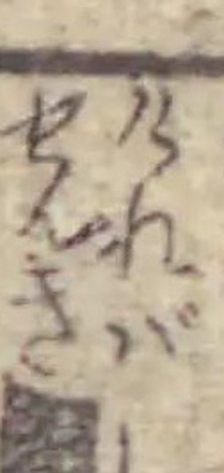せんき
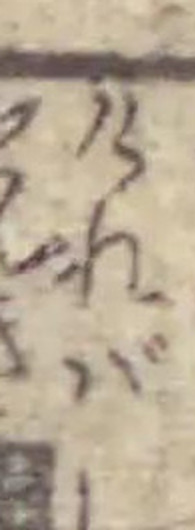ければ
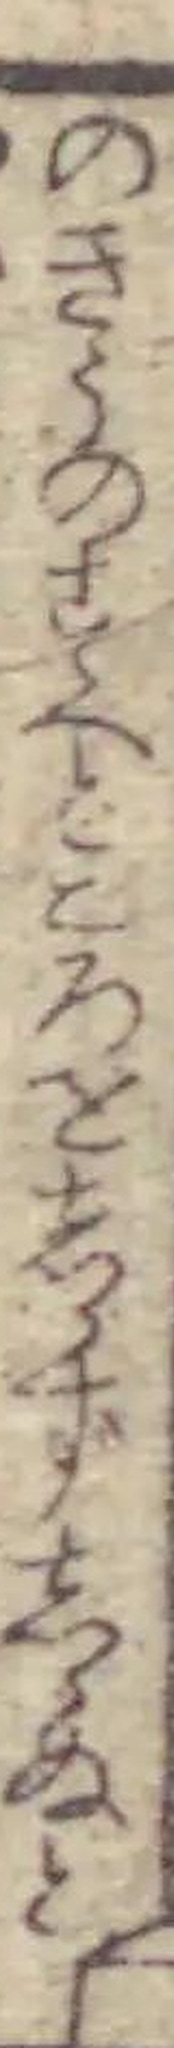のきうのすへどころをしらずしらぬと
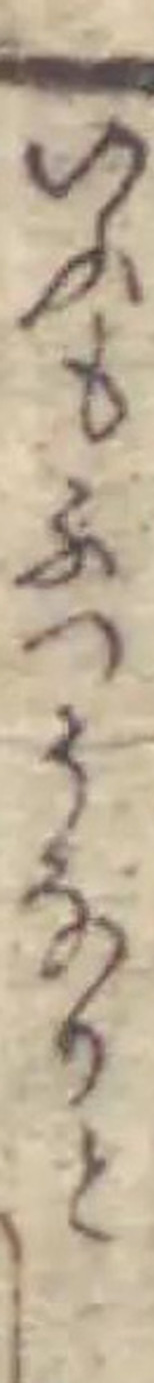いふもふつうなりと
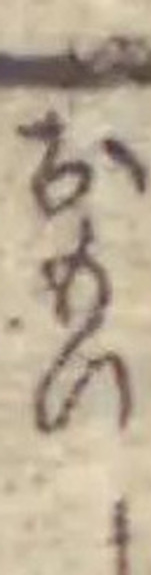おもい
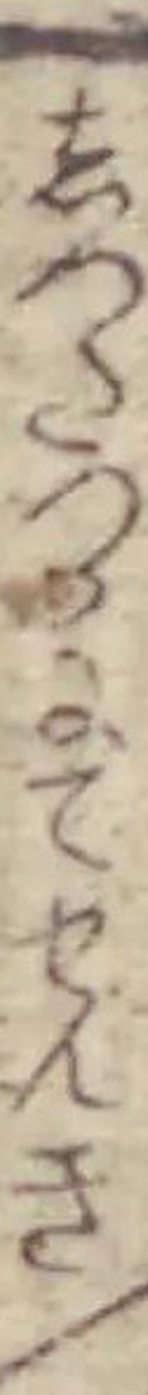しつたつらかにてせんき
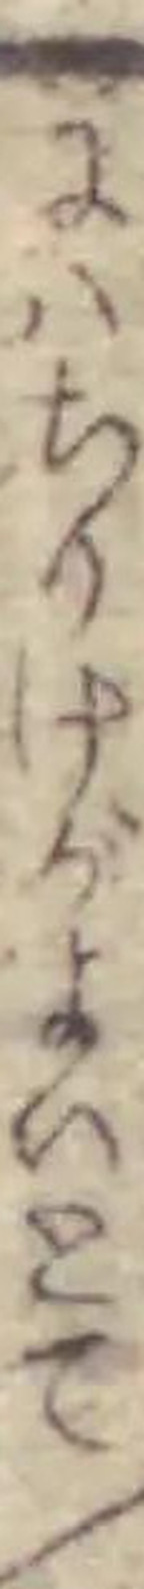にはちりけがよいとて
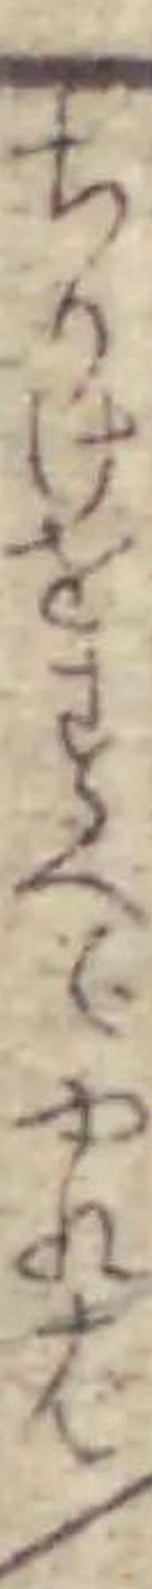ちりけをすへてやれば
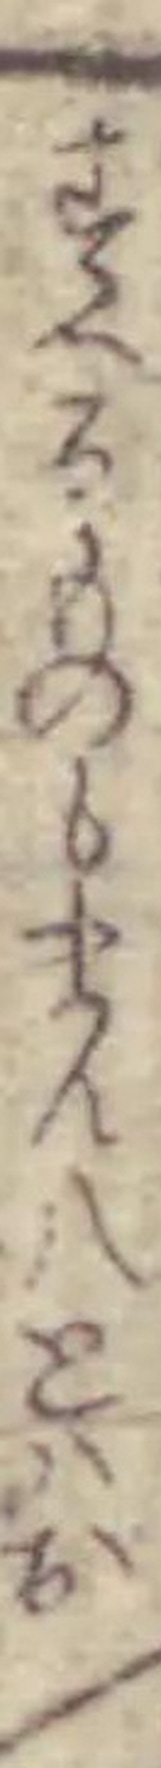すへるものもまん八とはお
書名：茶羅毛通人 3巻
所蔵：国立国会図書館 National Diet Library, JAPAN
